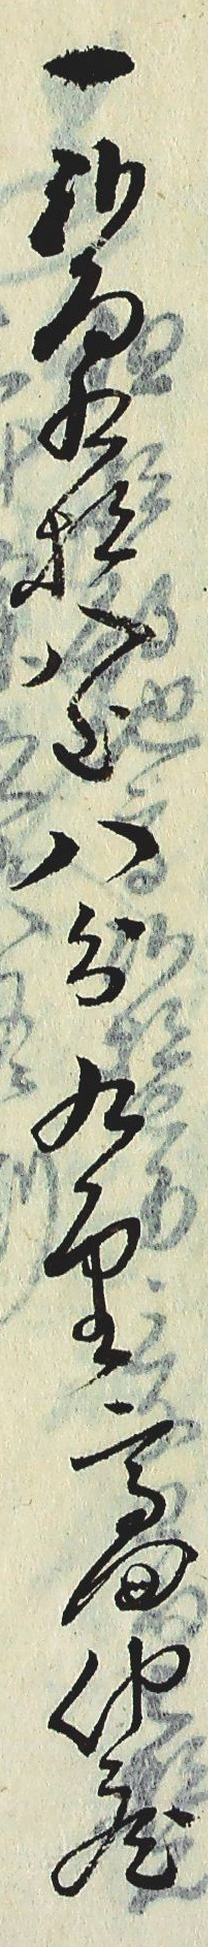一弐百九拾八匁八分九厘高田仲蔵
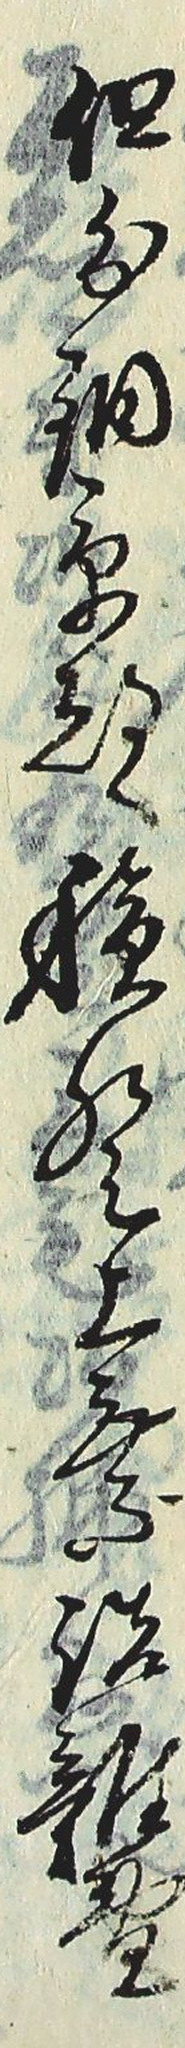但分銅京都へ積登上乗詰雑費

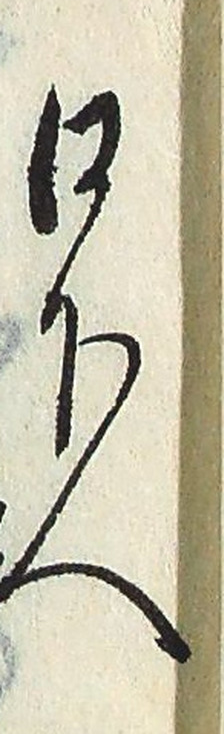同下人
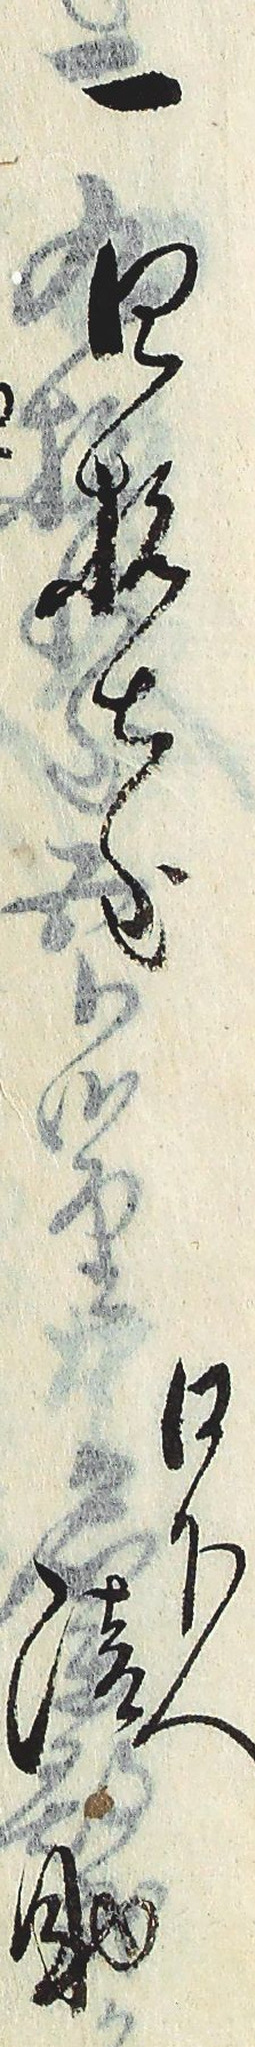一四拾七匁清助
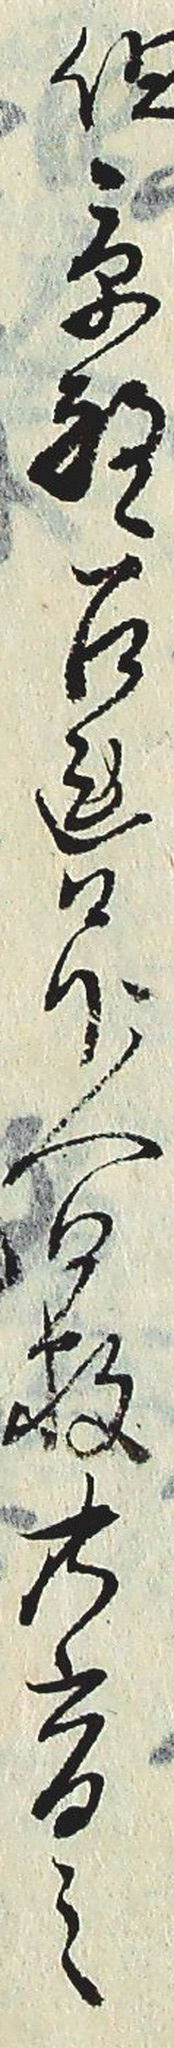但京都へ召連候下人日数廿六日之
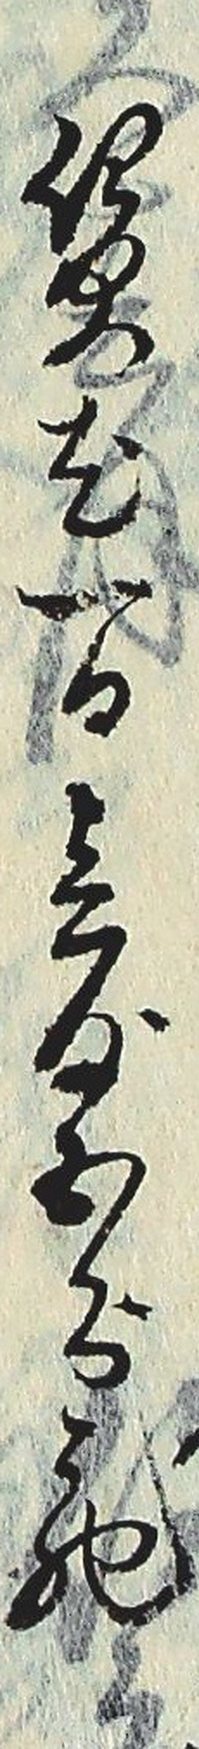賃尤一日壱匁五分宛
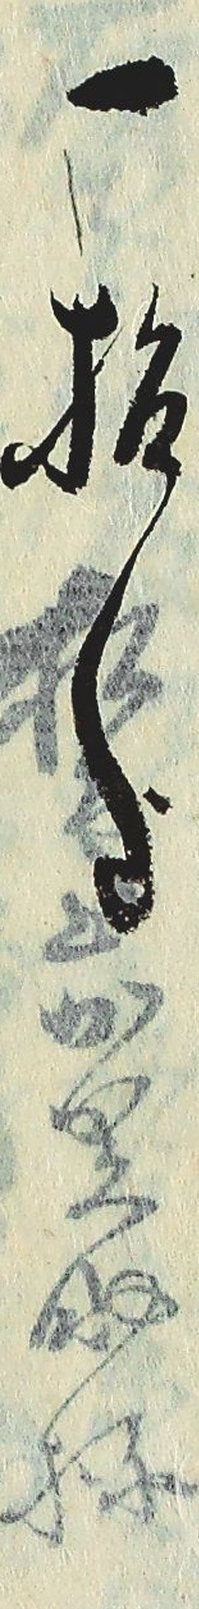一拾匁
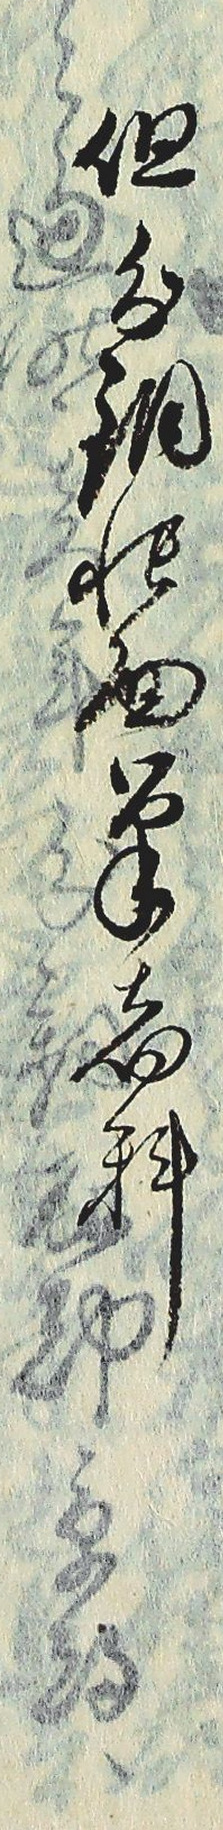但分銅帳面筆者料
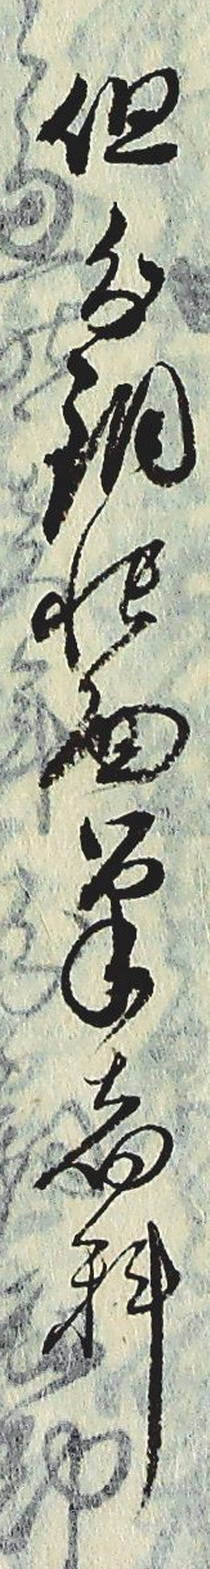但分銅帳面筆者料
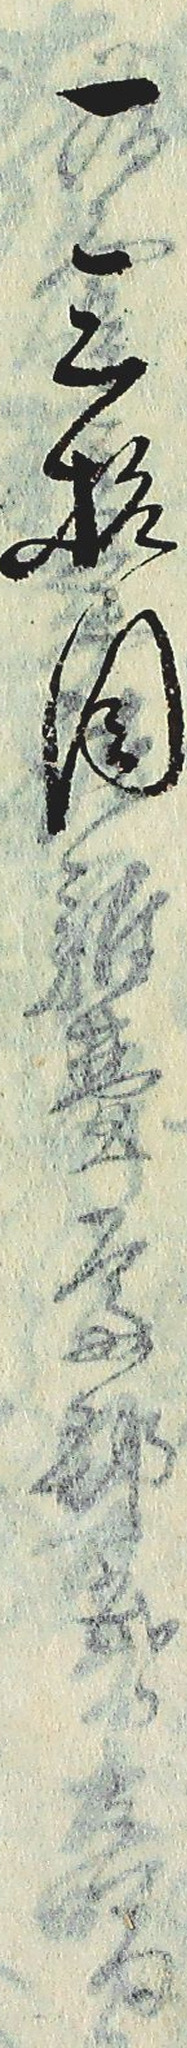一三拾目
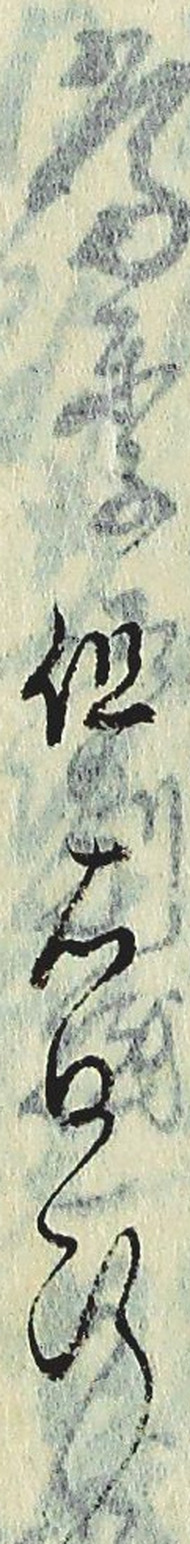但右同断
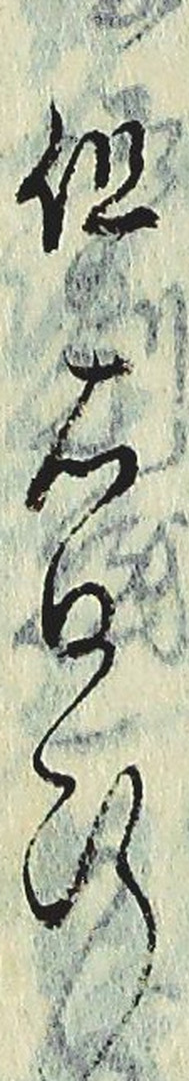但右同断
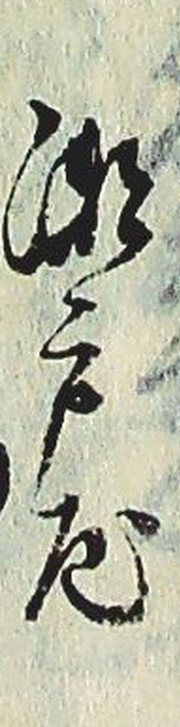瀬戸屋
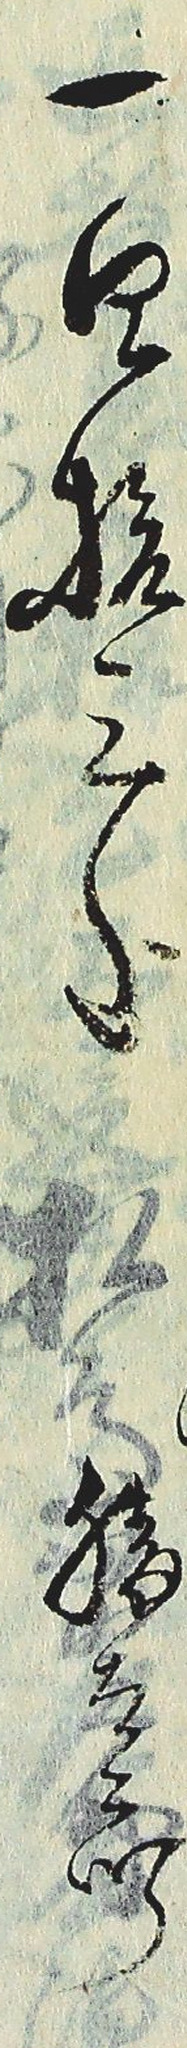一四拾三匁勝太郎
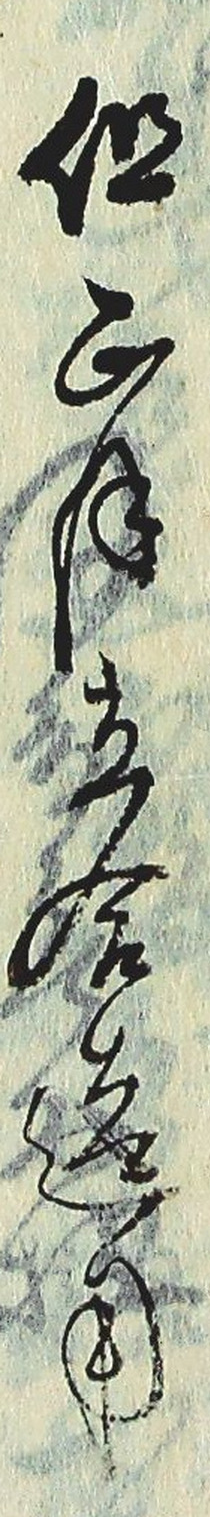但正月立合造用
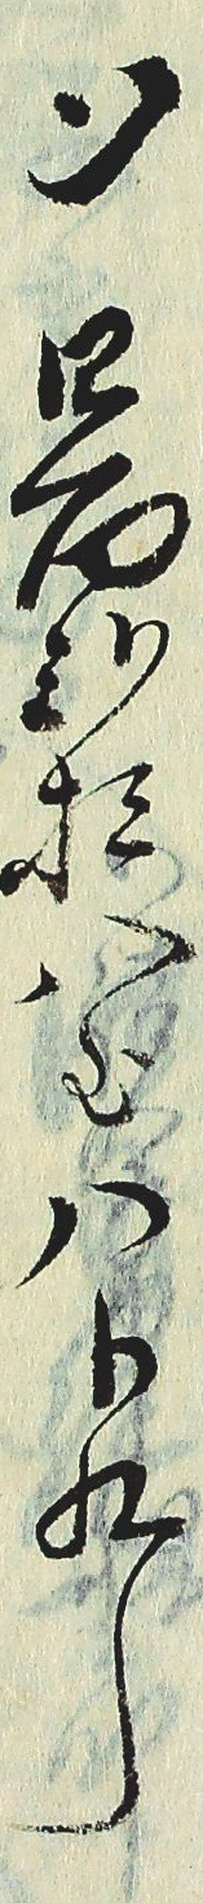〆四百弐拾八匁八分九厘
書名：名東郡中諸割賦元帳
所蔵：鳴門教育大学 Naruto University of Education
